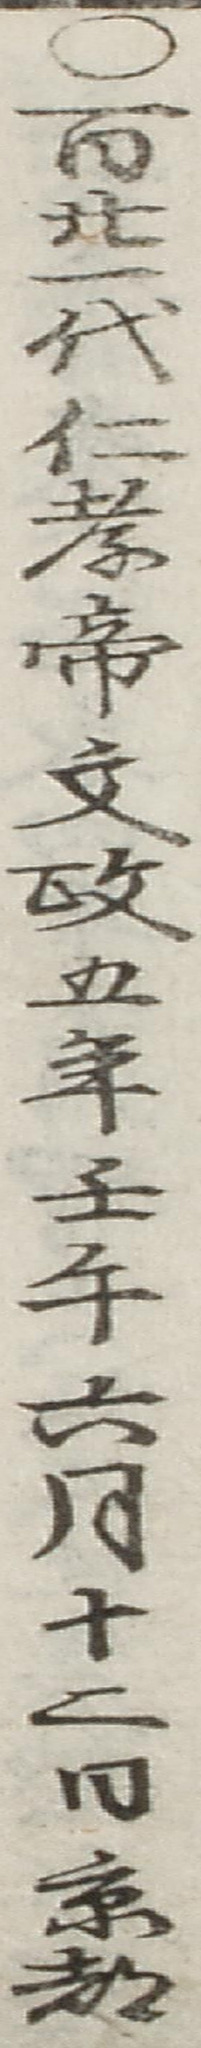○百廿一代仁孝帝文政五年壬午六月十二日京都
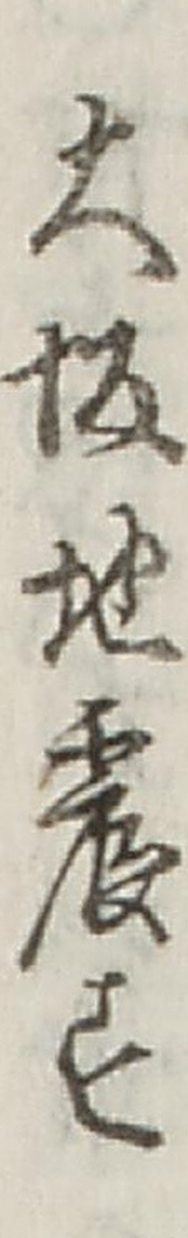大阪地震す
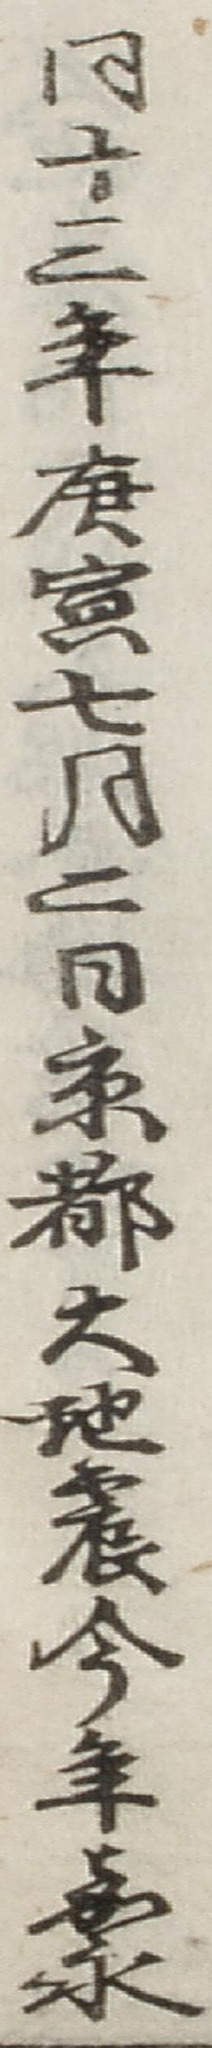同十三年庚寅七月二日京都大地震今年嘉永
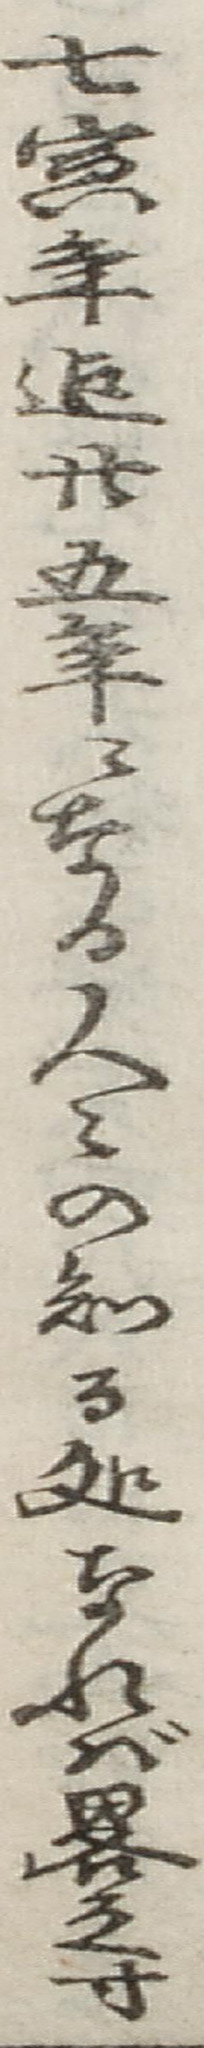七寅年迄廿五年になる人この知る処なれば略之す
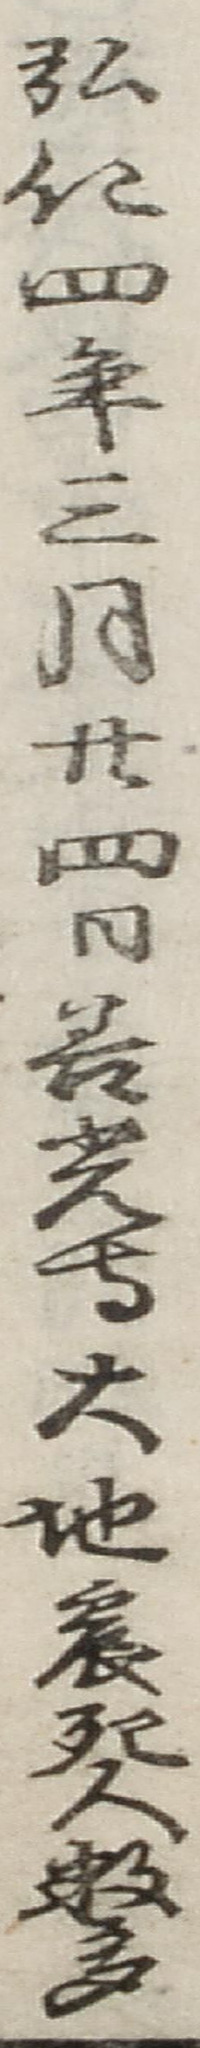弘化四年三月廿四日善光寺大地震死人数多
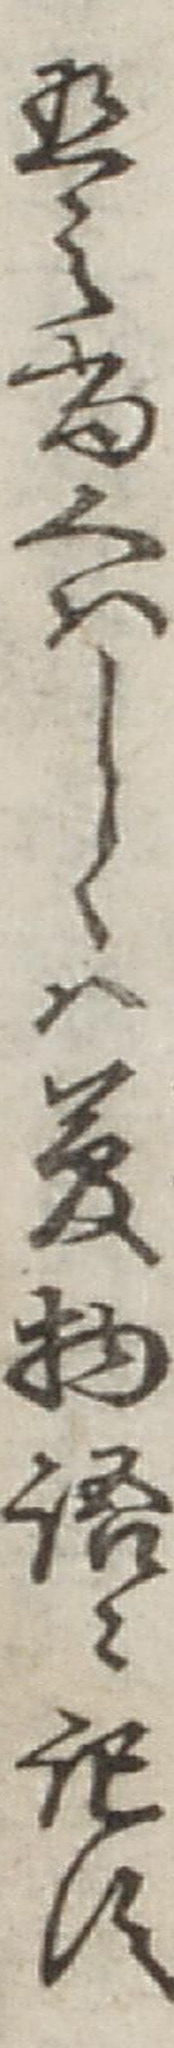有之尚くハしくハ夢物語に記す
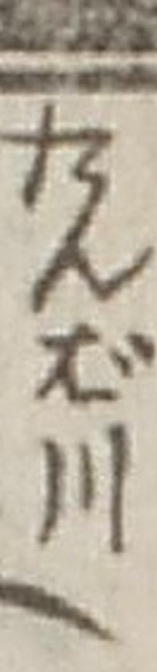たんば川
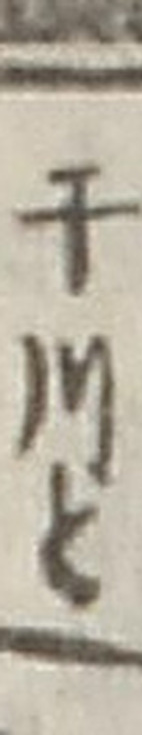干川と

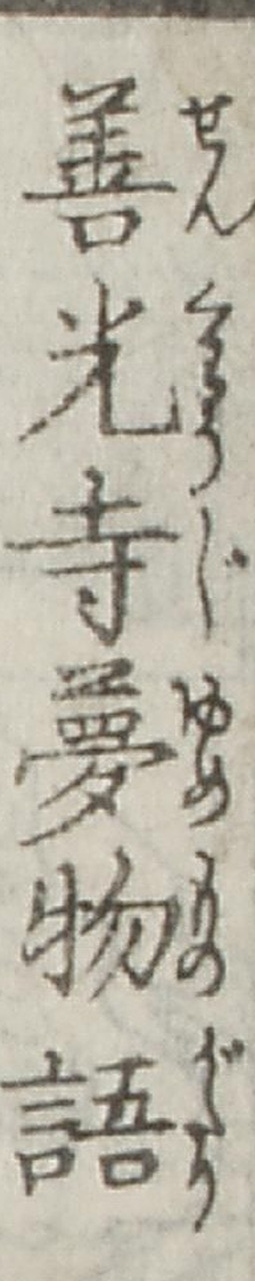善光寺夢物語
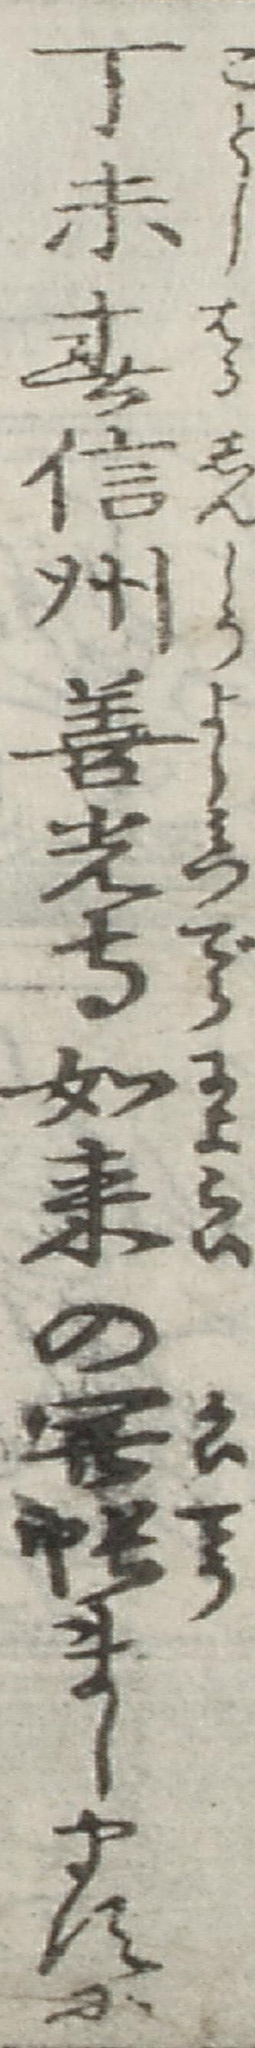丁未春信州善光寺如来の開帳ましますに
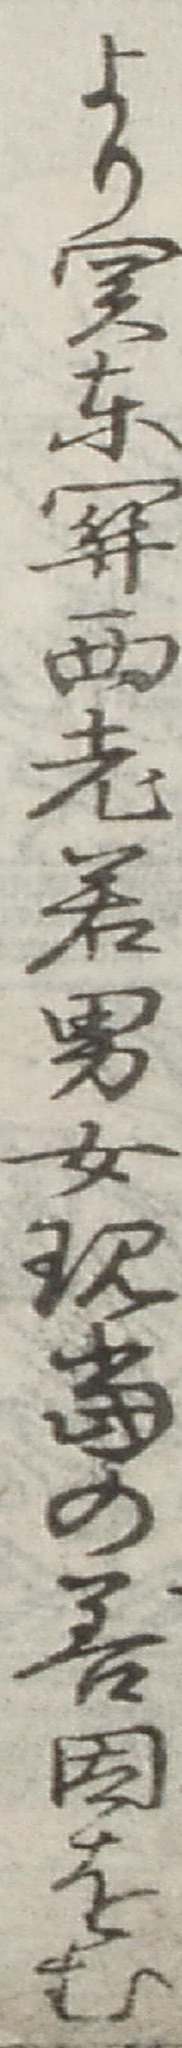より関東関西老若男女現当の善因をむ
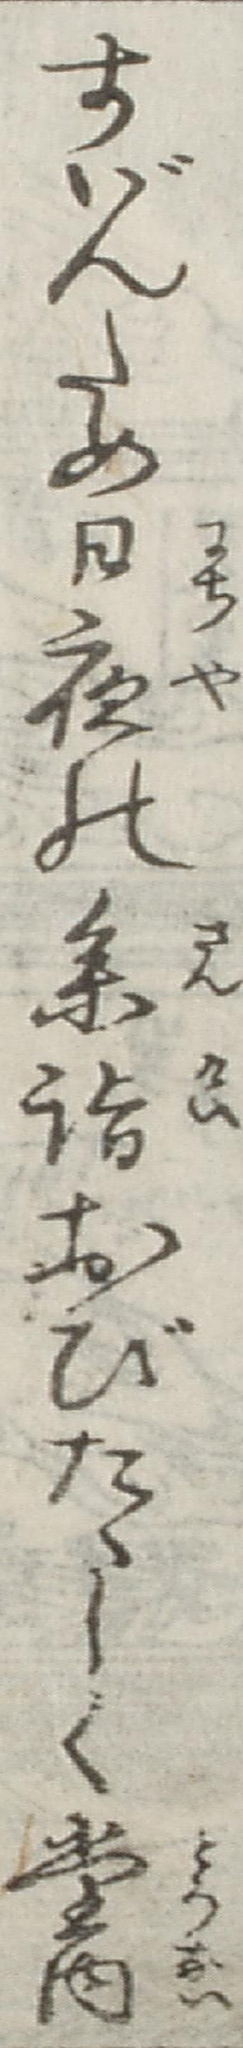すばんため日夜の参詣おびたゝしく堂内
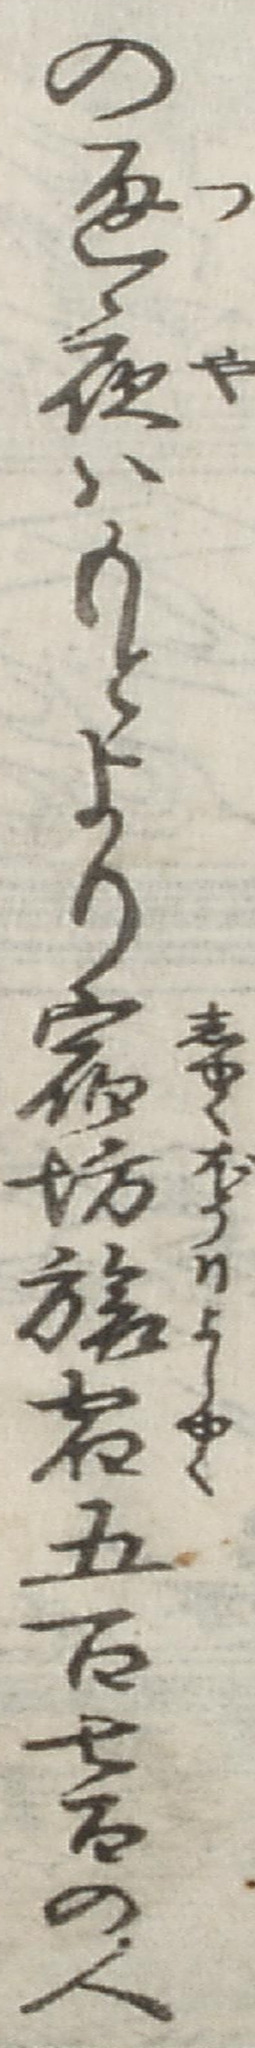の通夜はもとより宿坊旅宿五百七百の人
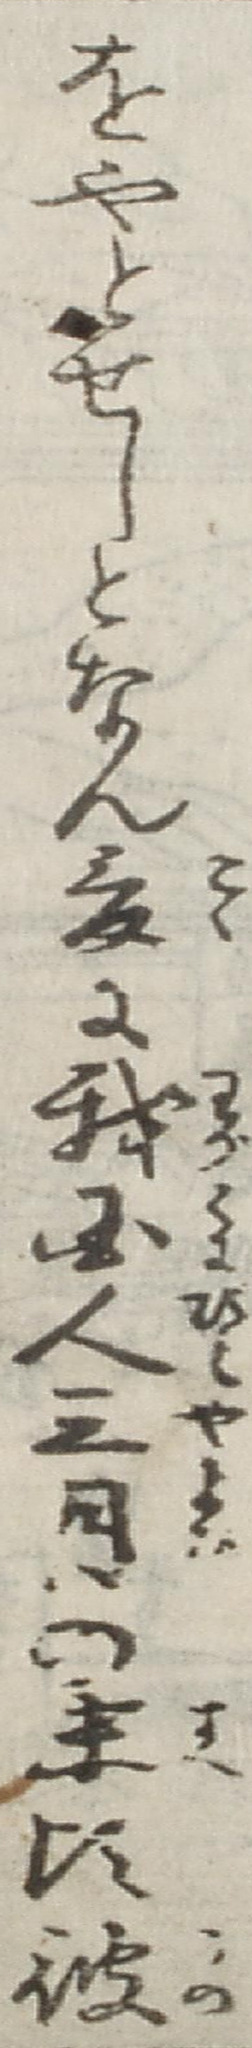をやどせしとなん爰に我国人三月の末頃彼
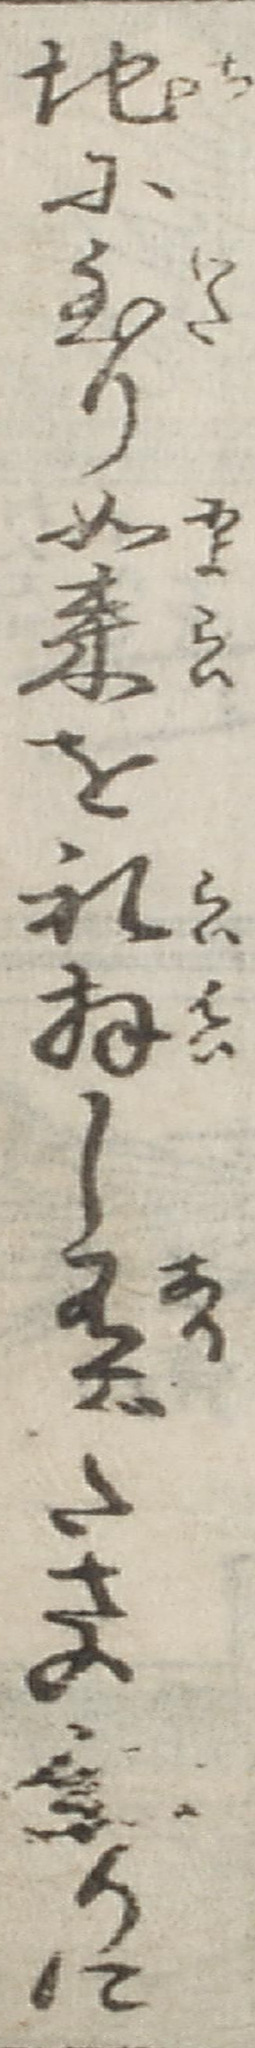地に至り如来を礼拝し有がたさの余りに
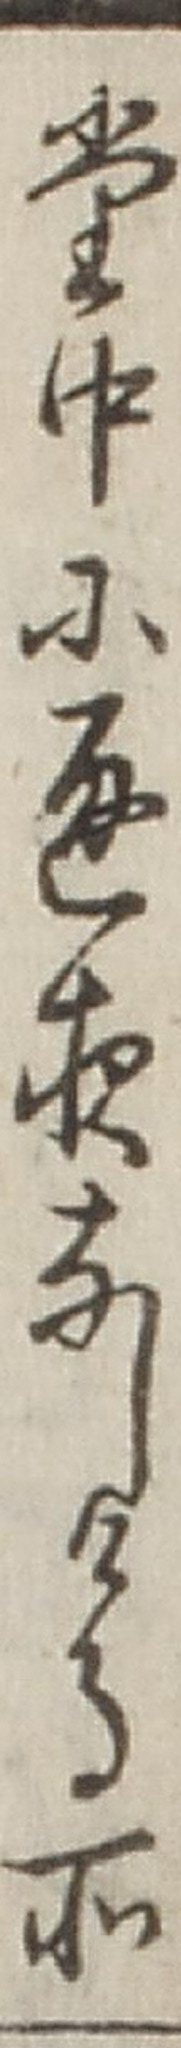堂中に通夜なしける所
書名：地震世直草紙　全
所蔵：東京大学地震研究所図書室 Earthquake Research Institute Library, The University of Tokyo, JAPAN
